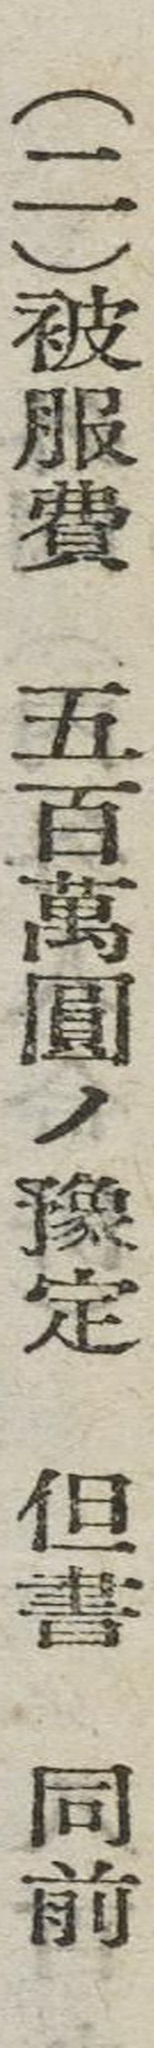被覆費五百万円ノ予定但書同前
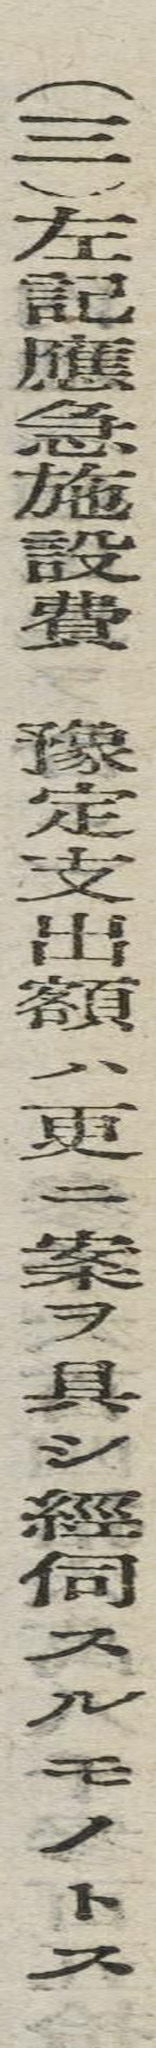左記応急施設費予定支出額ハ更ニ案ヲ具シ経伺スルモノトス
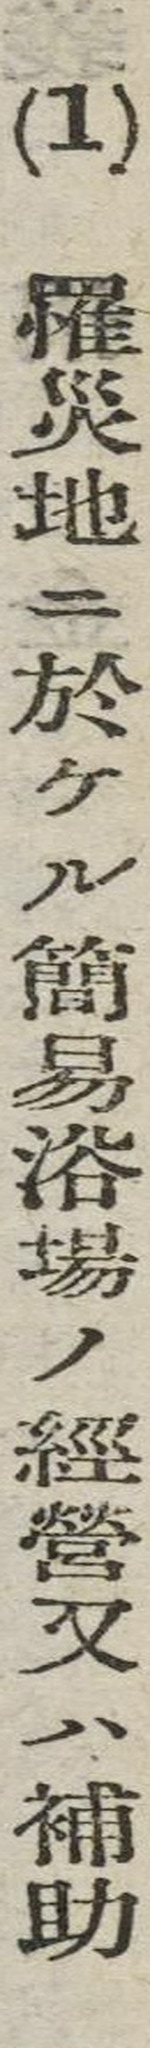⑴罹災地ニ於ケル簡易浴場ノ経営又ハ補助
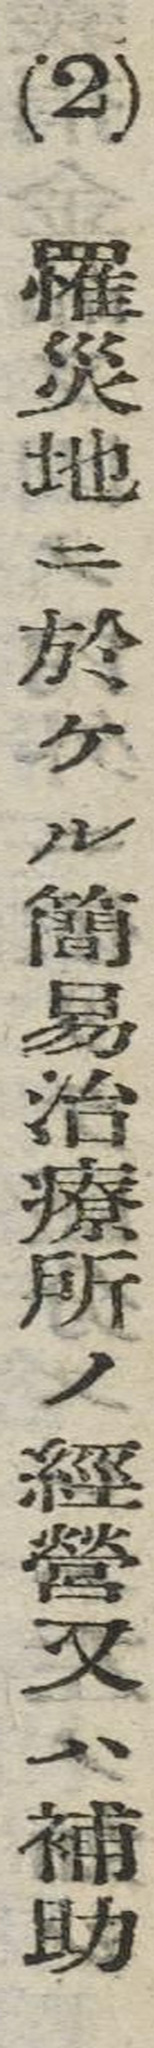⑵罹災地ニ於ケル簡易治療所ノ経営又ハ補助
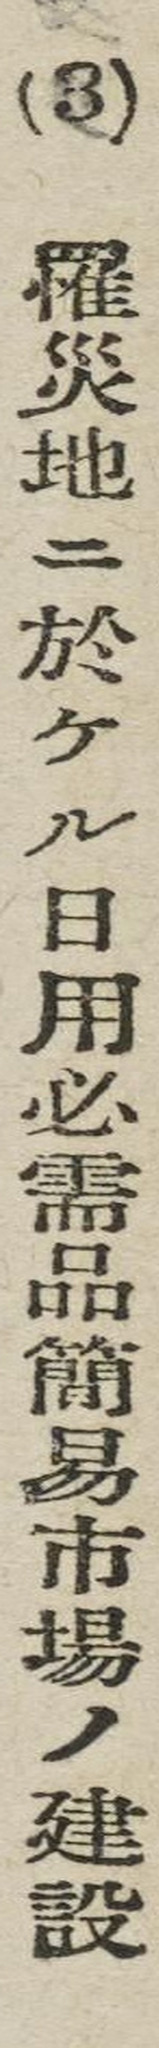⑶罹災地ニ於ケル日用必需品簡易市場ノ建設
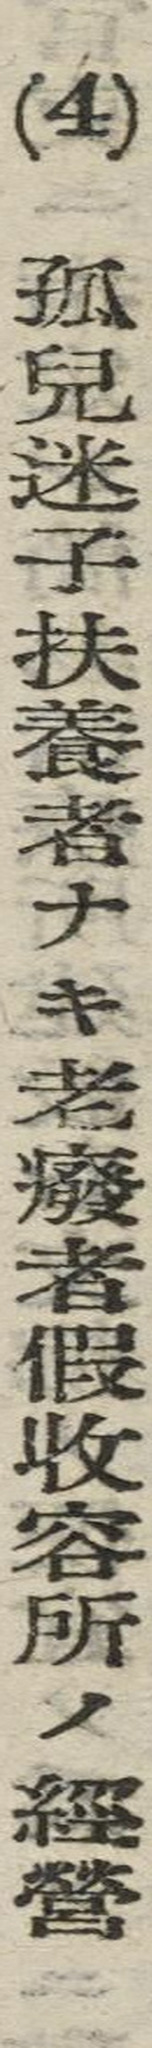⑷孤児迷子扶養者ナキ老廃者仮収容所ノ経営
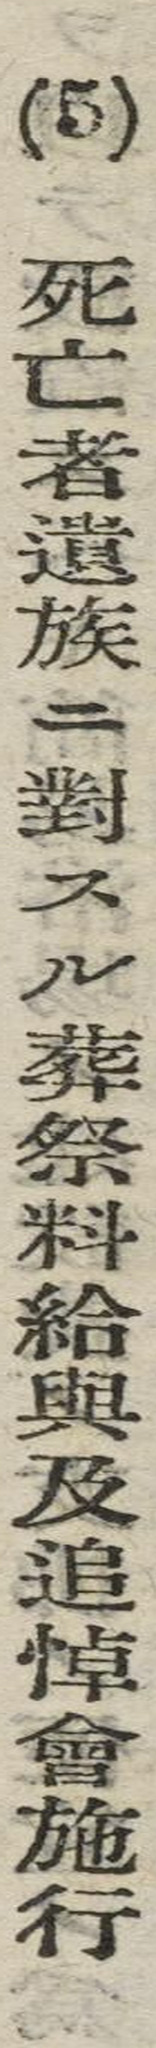⑸死亡者遺族ニ対スル葬祭料給与及追悼会施行
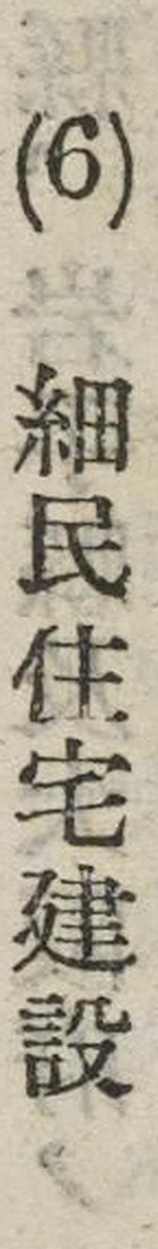⑹細民住宅建設
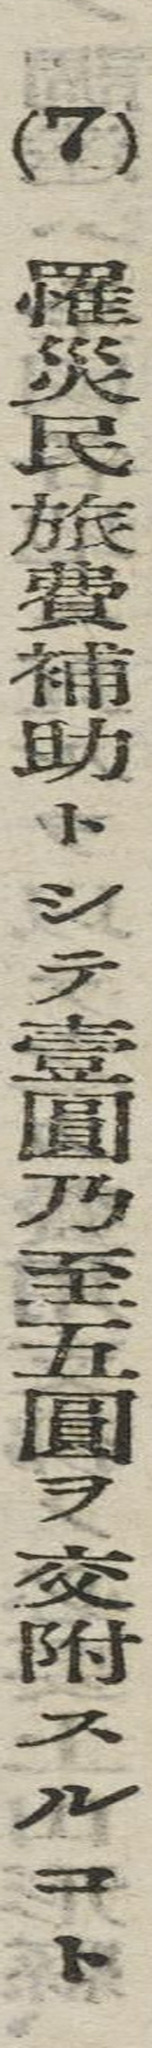⑺罹災民旅費補助トシテ壱円乃至五円ヲ交附スルコト
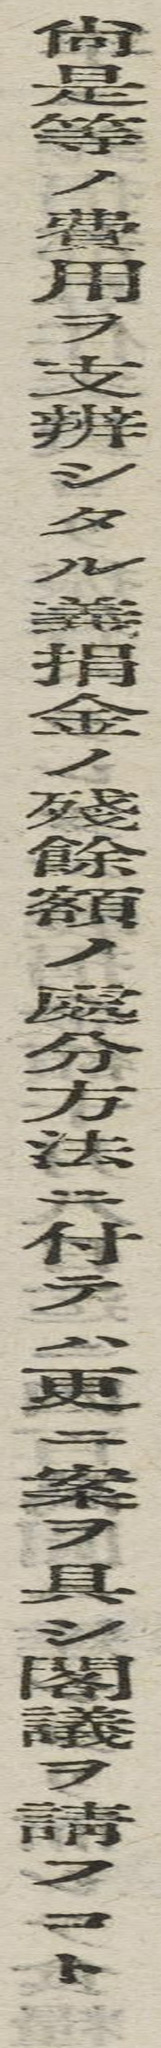尚是等ノ費用ヲ支弁シタル義捐金ノ残余額ノ処分方法ニ付テハ更ニ案ヲ具シ閣議ヲ請フコト
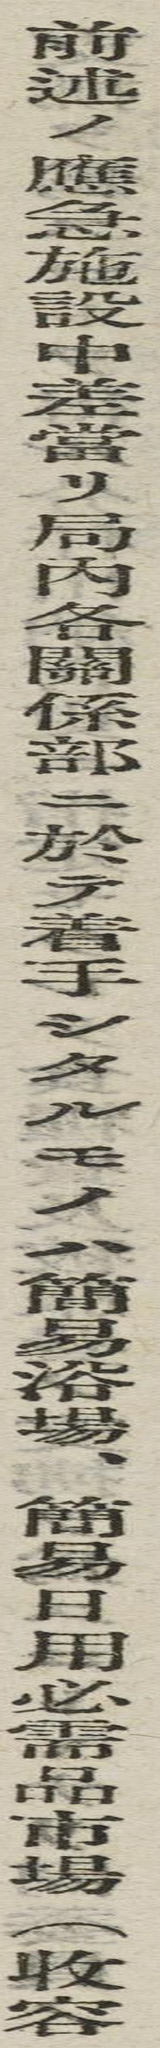前述ノ応急施設中差当リ局内各関係部ニ於テ着手シタルモノハ簡易浴場、簡易日用必需品市場（収容
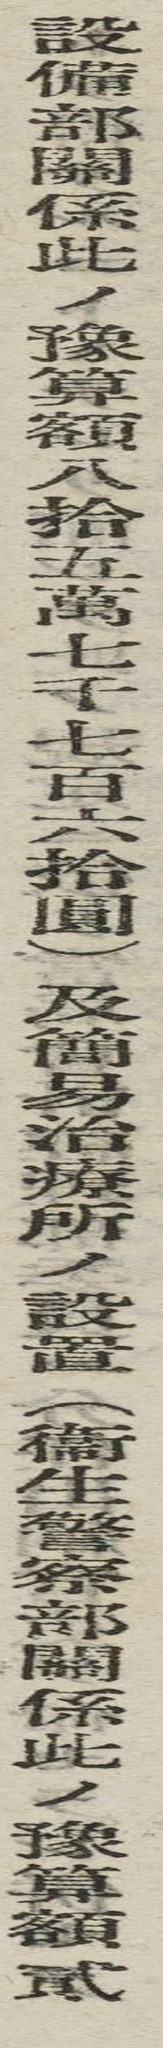設備部関係此ノ予算額八拾五万七千七百六拾円）及簡易治療所ノ設置（衛生警察部関係此のノ予算額弐
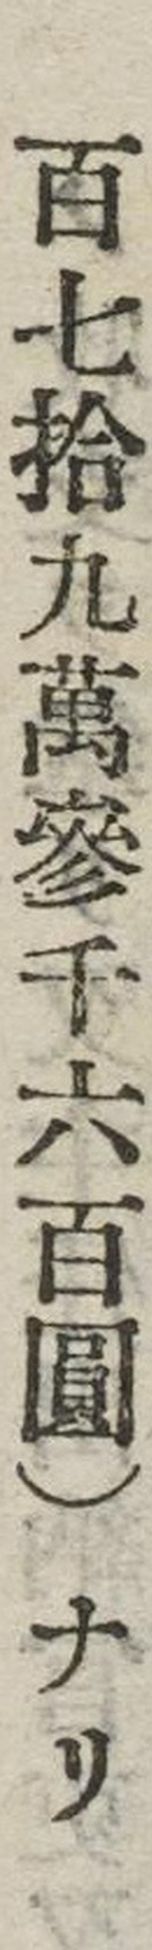百七拾九万参千六百円）ナリ
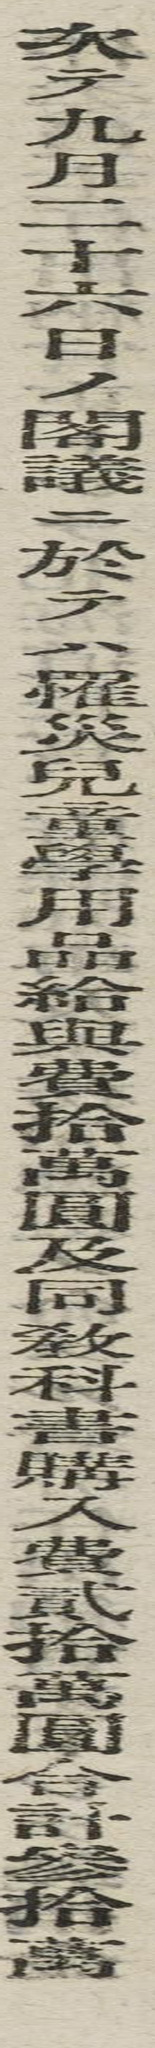次テ九月二十六日ノ閣議ニ於テハ罹災児童学用品給与費拾万円及同教科書購入費弐拾万円合計参拾万
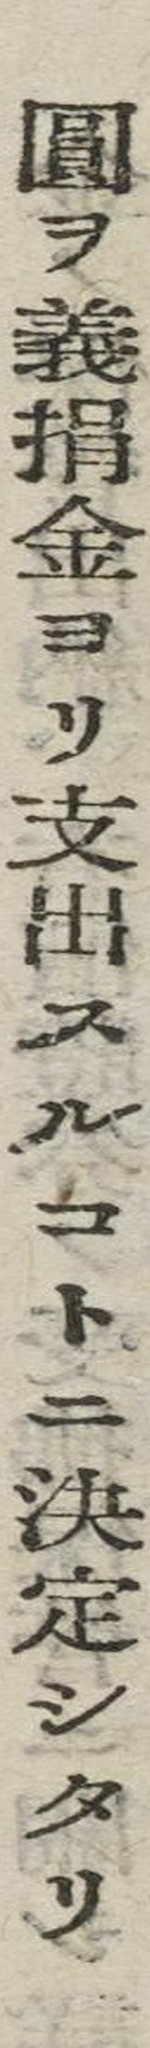円ヲ義捐金ヨリ支出スルコトニ決定シタリ
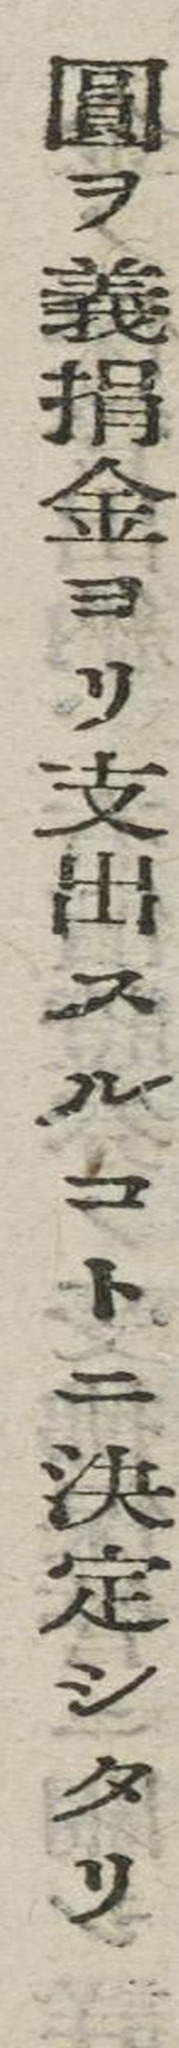円ヲ義捐金ヨリ支出スルコトニ決定シタリ
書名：震災被害状況並救護施設概要
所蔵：東京大学地震研究所図書室 Earthquake Research Institute Library, The University of Tokyo, JAPAN
